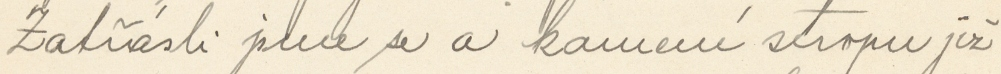Zatřásli jsme se a kamení stropu již
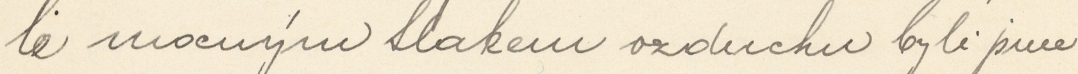le mocným tlakem vzduchu byli jsme
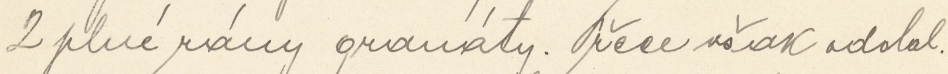2 plné rány granáty. Přece však odolal.
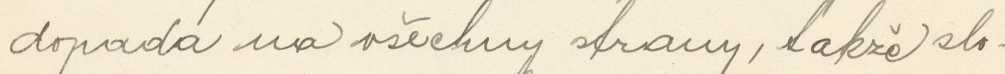dopadá na všechny strany, takže slo-
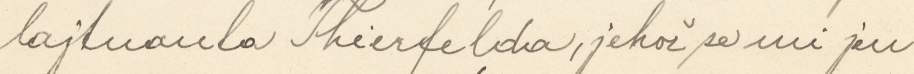lajtnanta Thierfelda, jehož se mi jen
